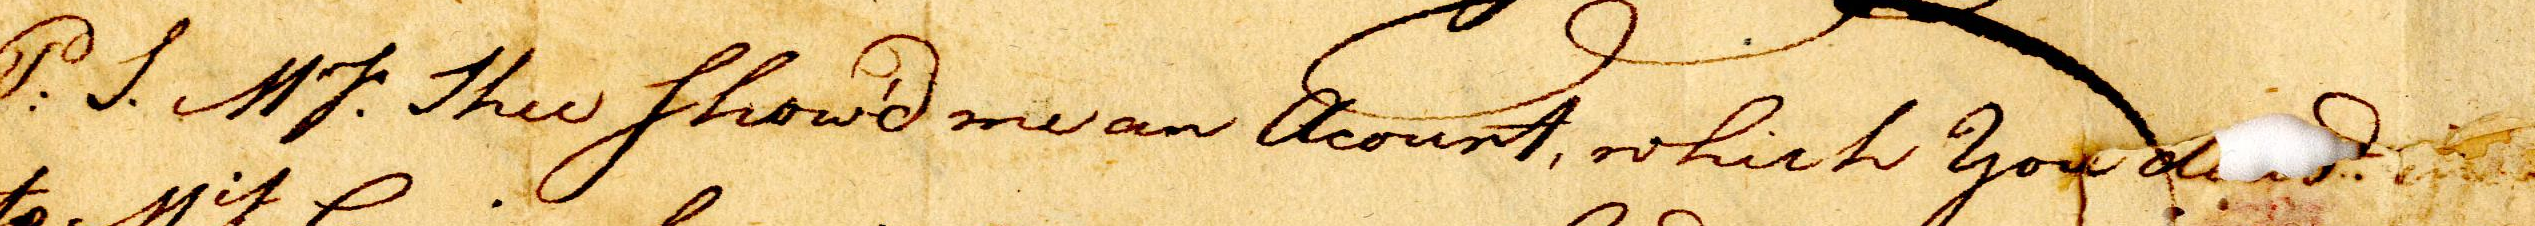P.S. M^r. Shee show'd me an Acount, which You [d___]
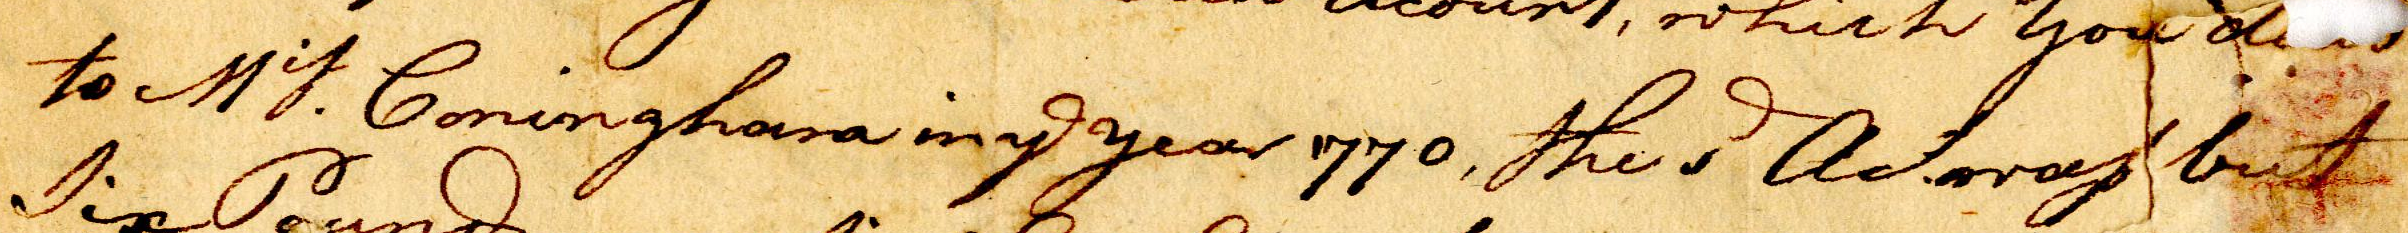to M^is. Coningham in y^e year 1770, the s^d Ac^t [_____] but
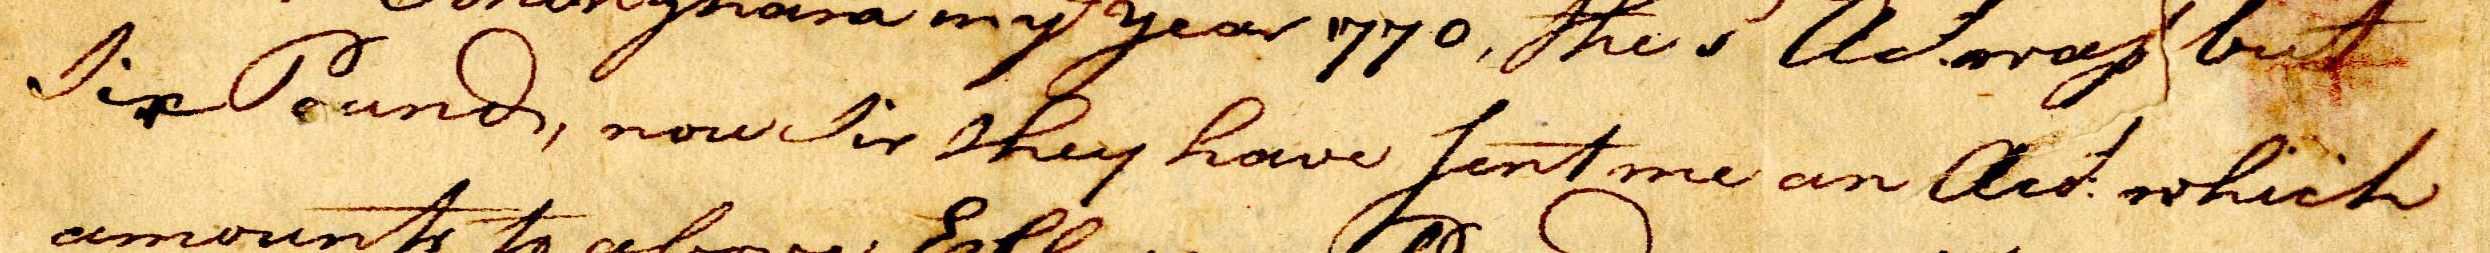Six Pound, now Sir they have sent me an Ac^t. which
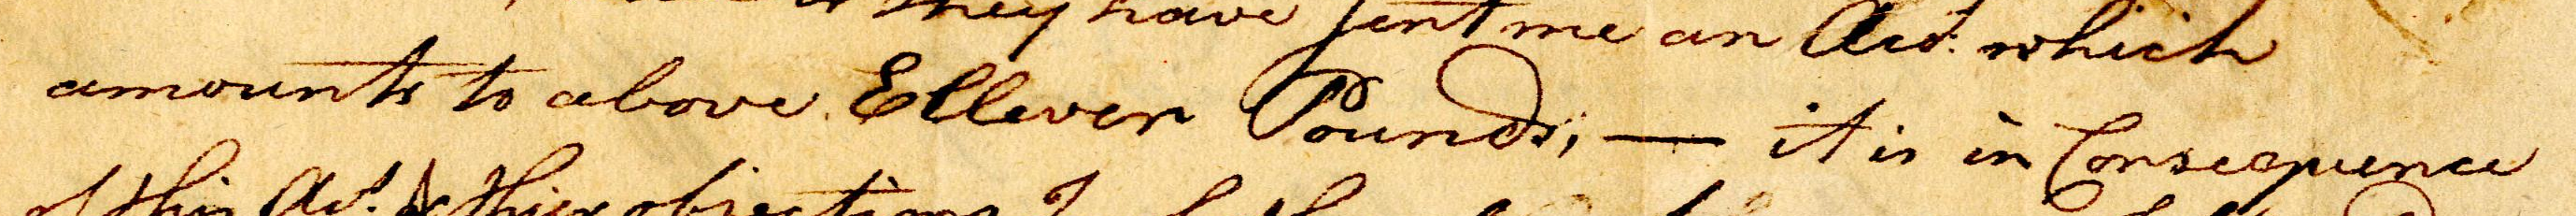amounts to above Elleven Pounds;- it is in Consequence
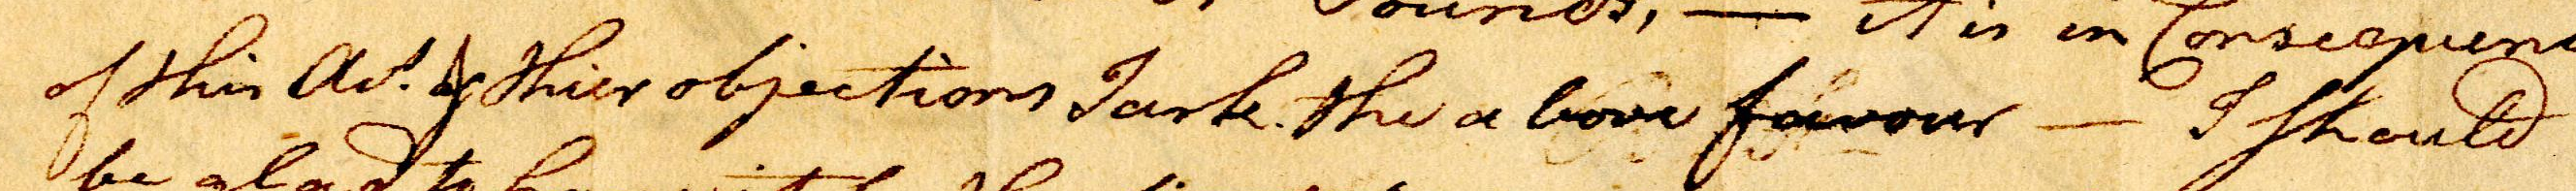of this Ac^t. & thier objections I ask the above favour- I should
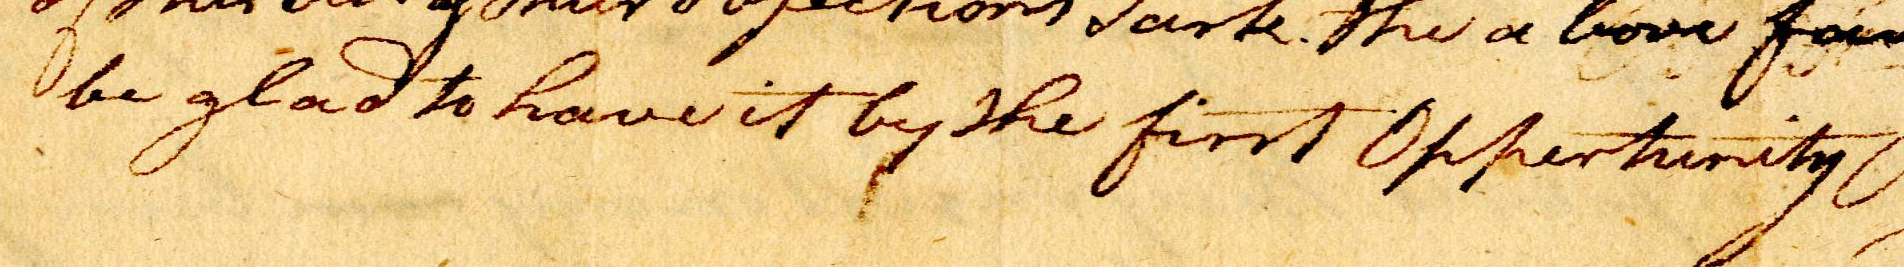be glad to have it by the first Oppertunity
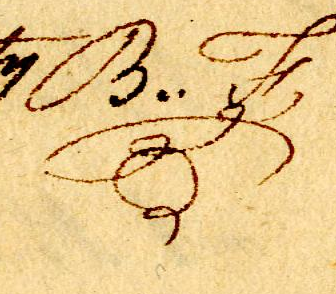B. F
